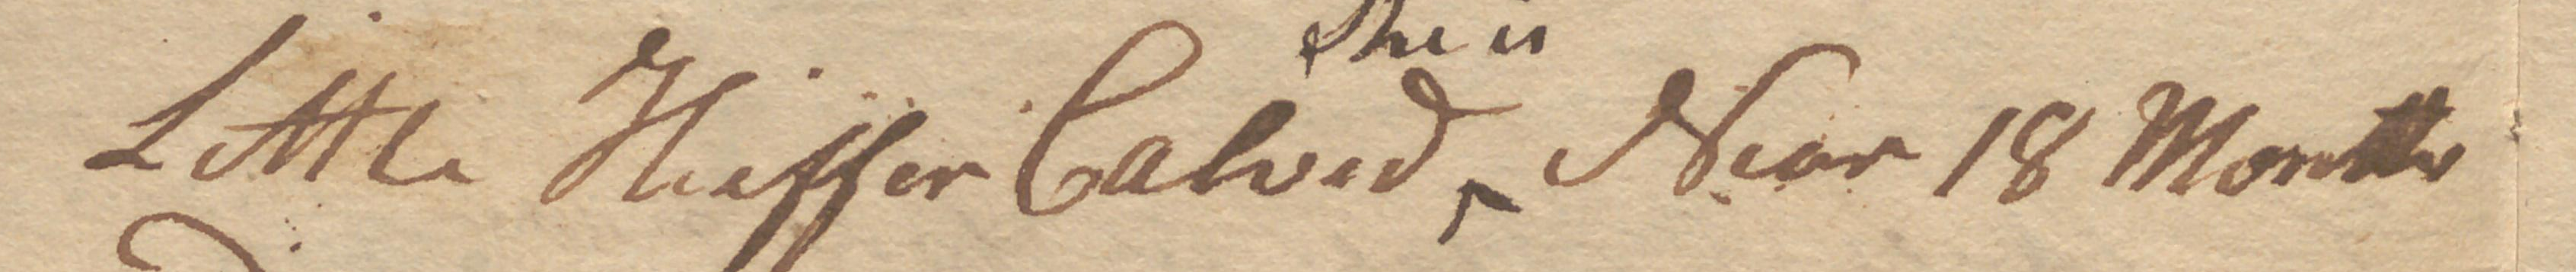Little Heiffer Calved, Near 18 Months
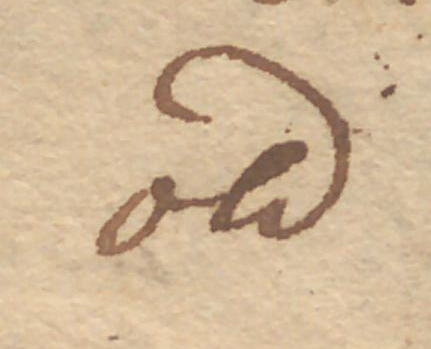old
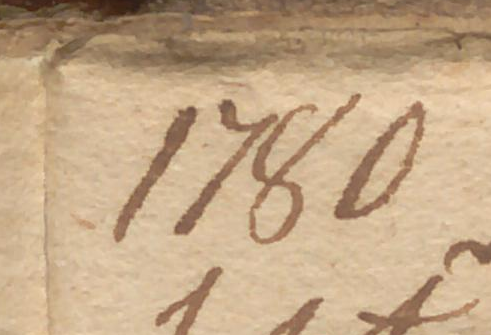1780
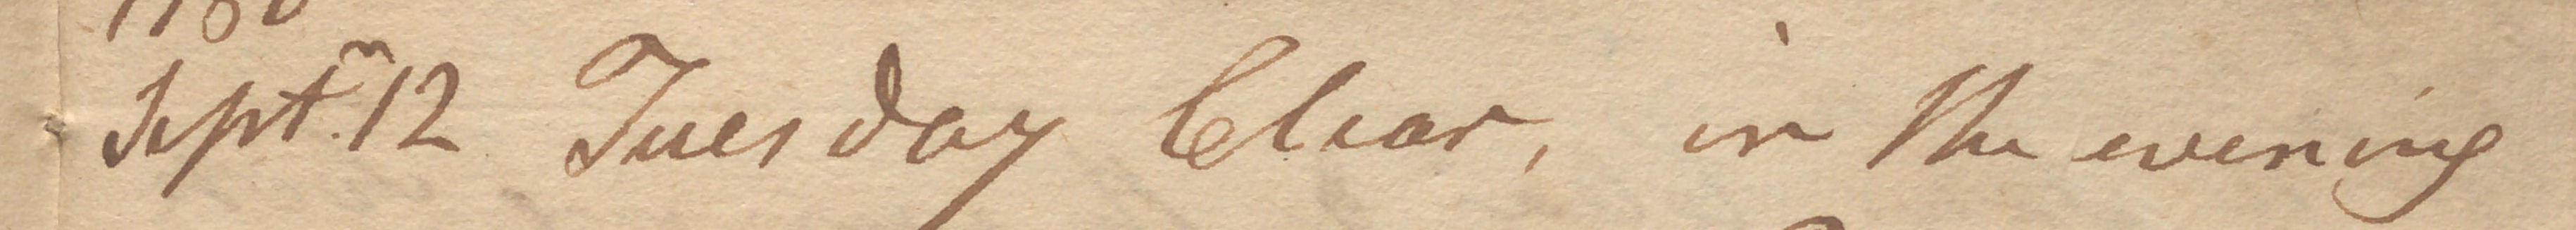Septr 12 Tuesday Clear, in the evening
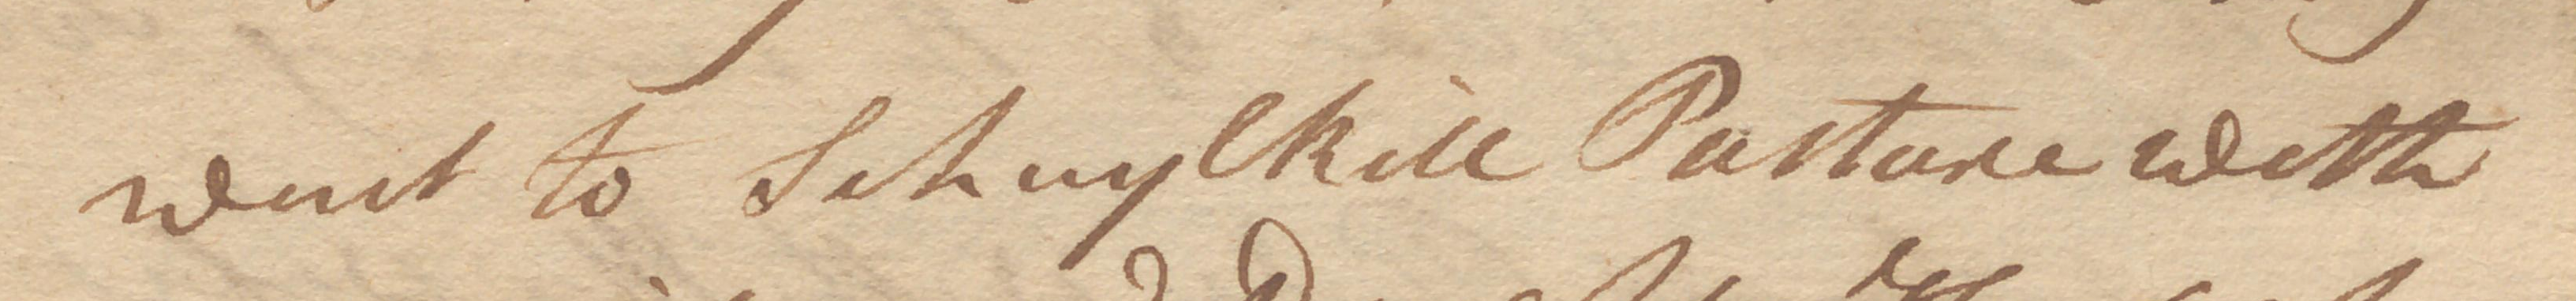went to Schuylkill Pasture with
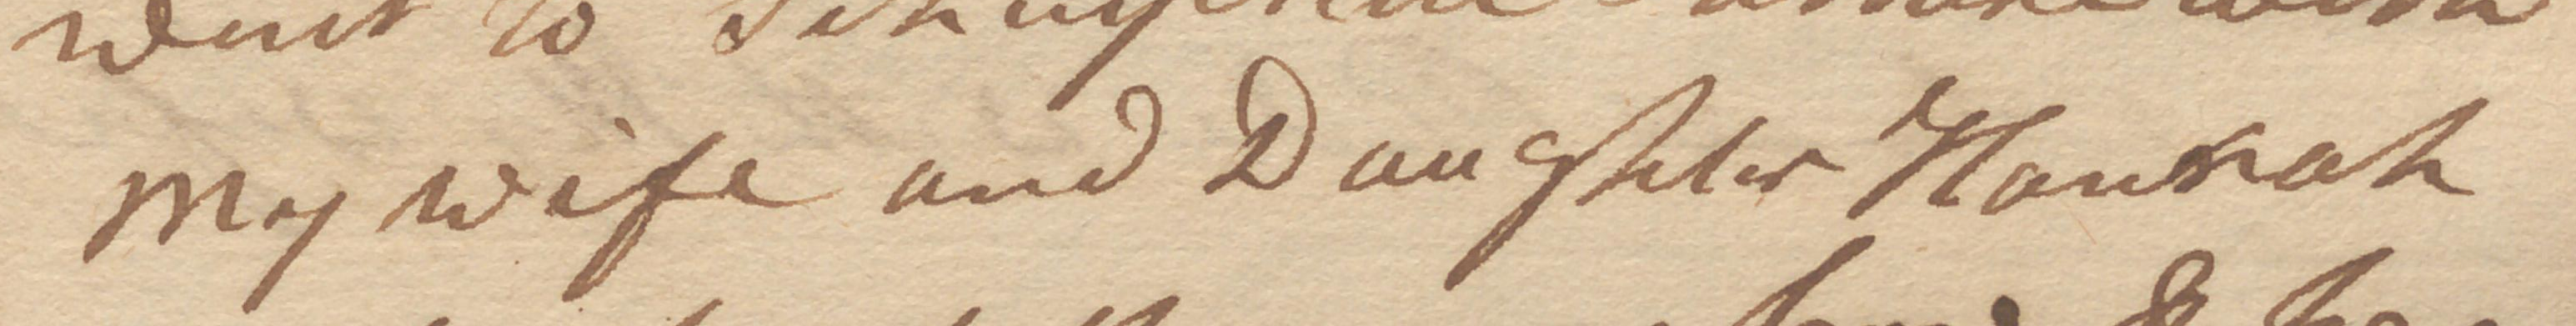my wife and Daughter Hannah
